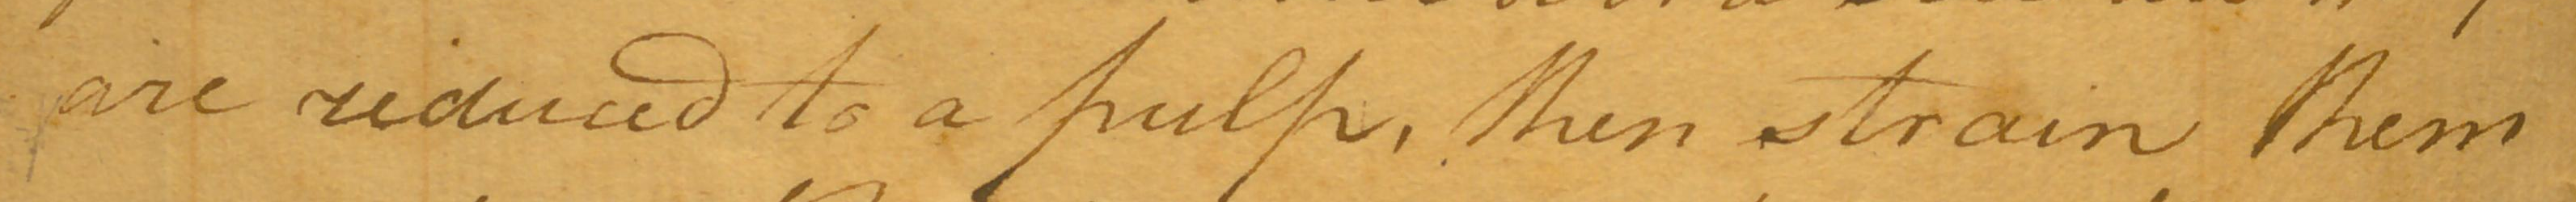are reduced to a pulp, then strain them
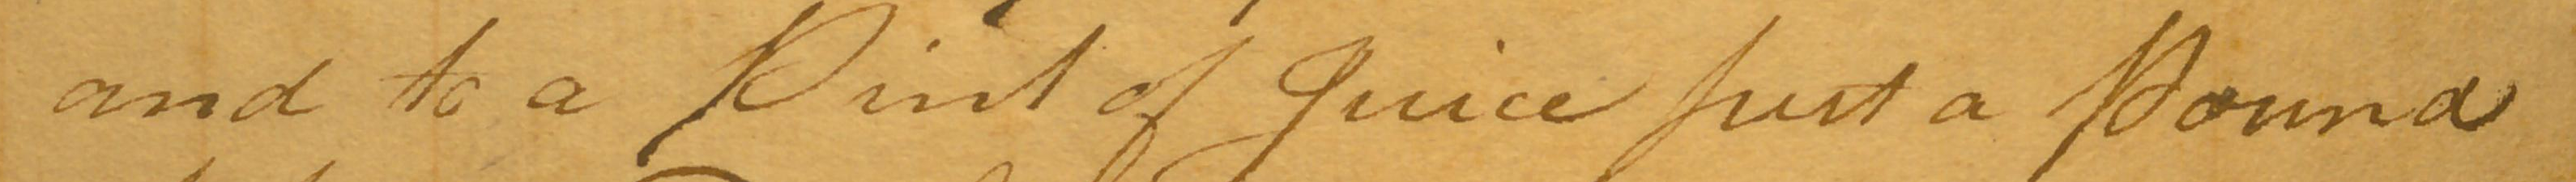and to a Pint of Juice just a Pound
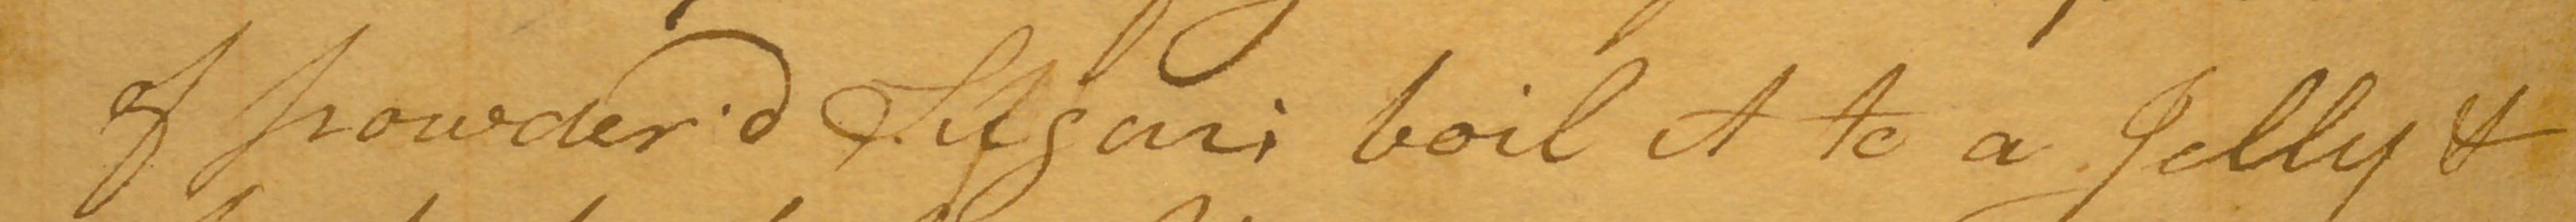of powder'd Sugar; boil it to a Jelly &
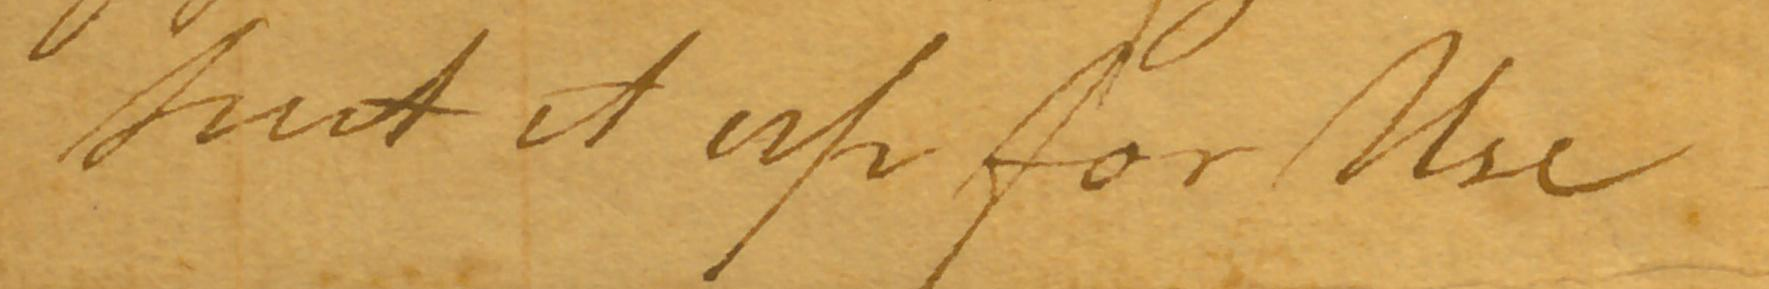put it up for Use
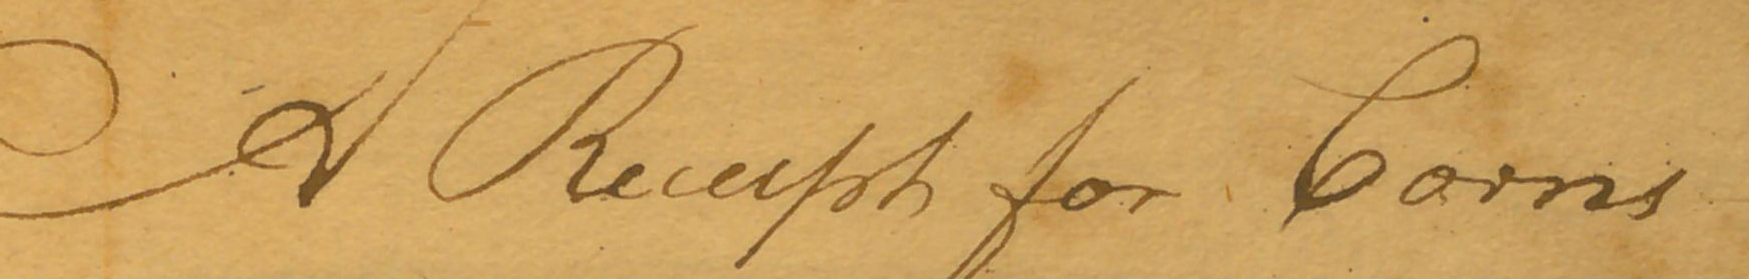A Receipt for Corns
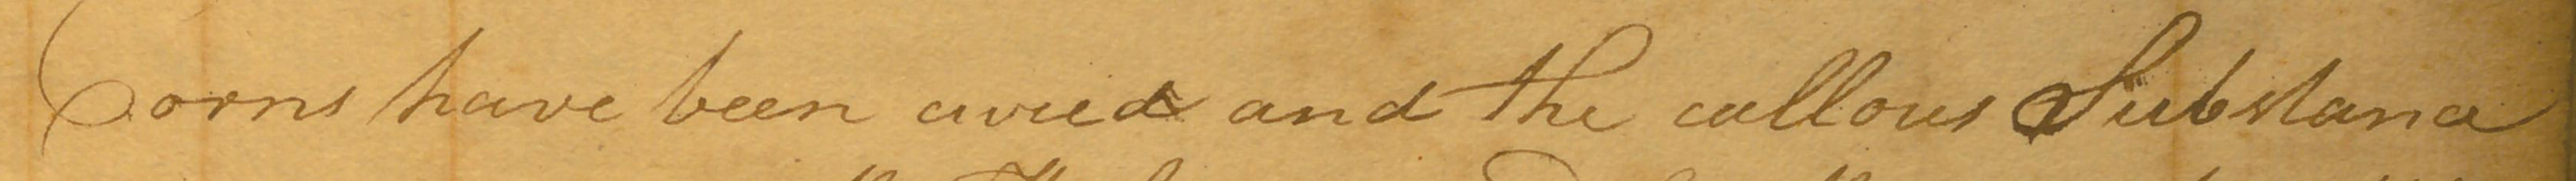Corns have been cured and the callous Substance
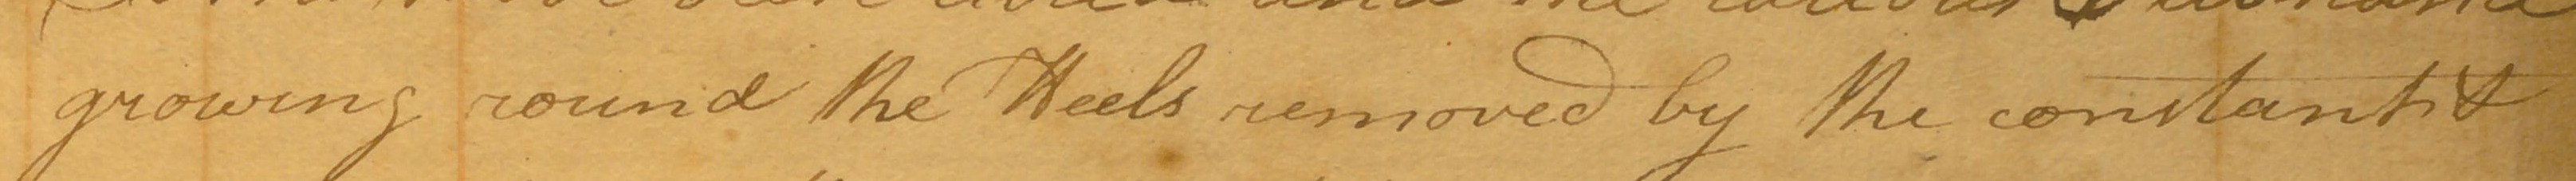growing round the Heels removed by the constant &
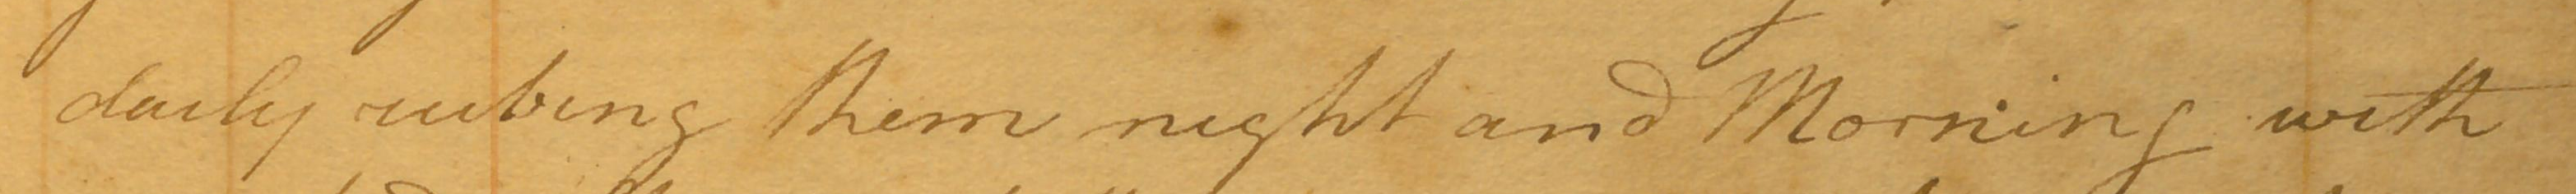daily rubing them night and Morning with
